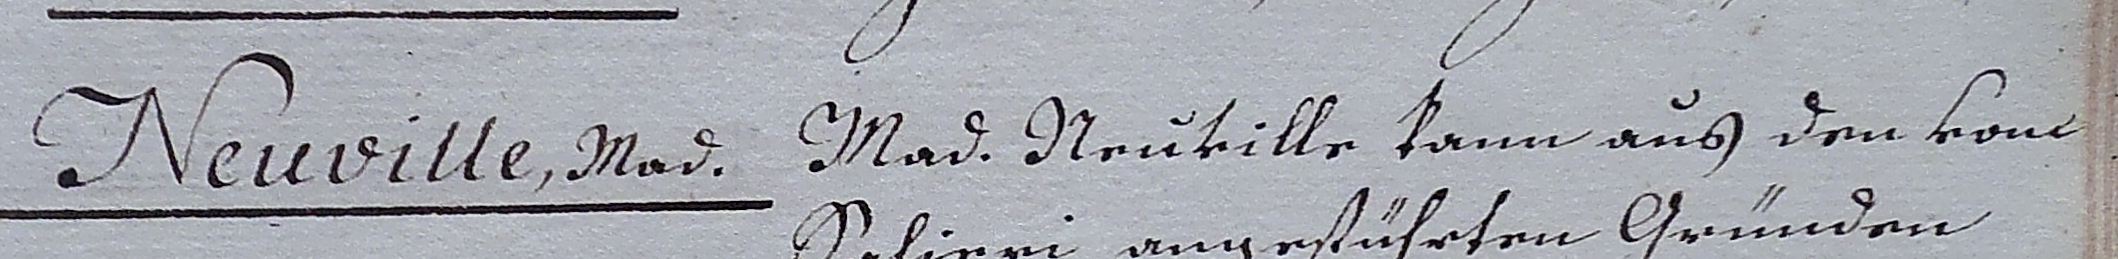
Neuville, Mad. Mad. Neuville kann aus den vom
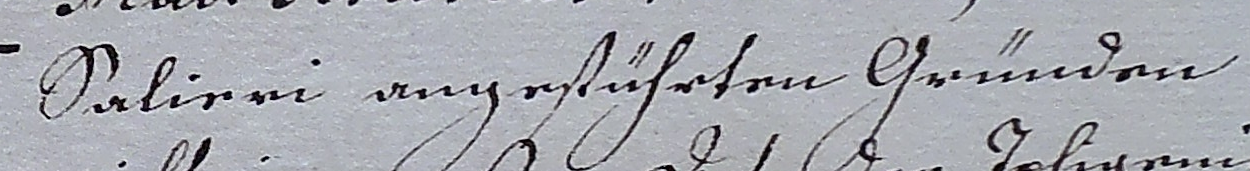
Salieri angeführten Gründen
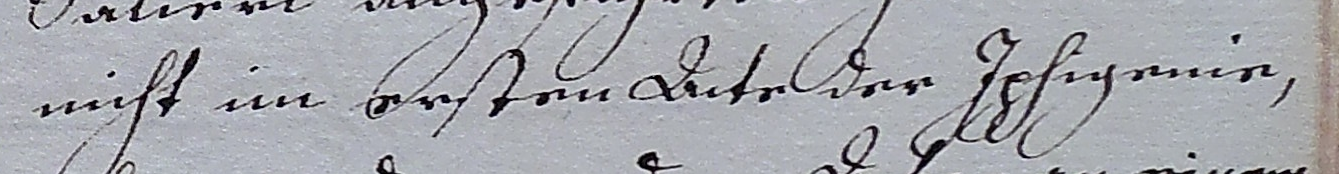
nicht im ersten Acte der Iphigenie,
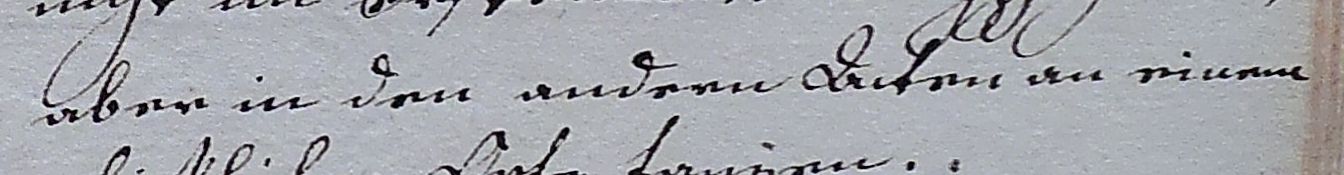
aber in den andern Acten an einem
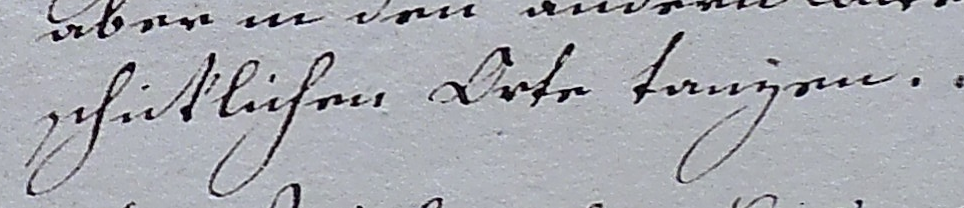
schicklichen Orte tanzen.
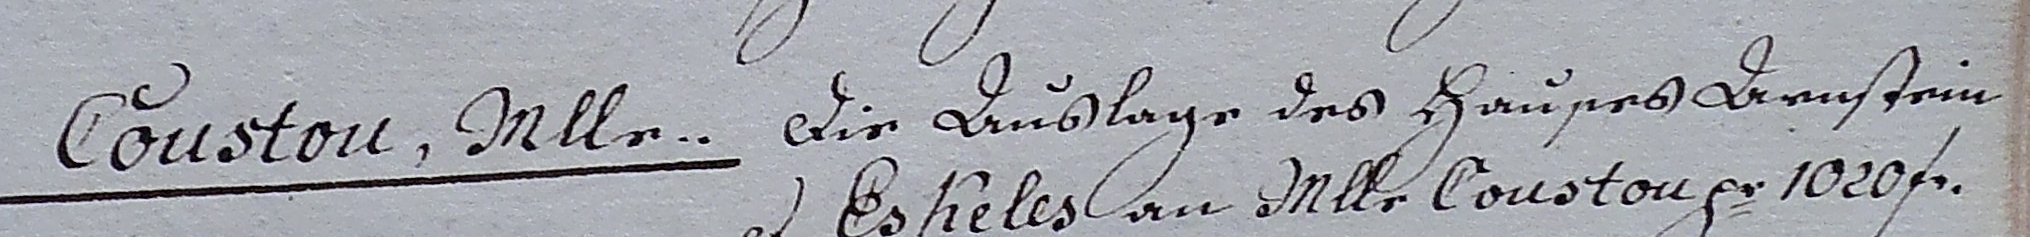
Coustou, Mlle.. Die Auslage des Hauses Arnstein
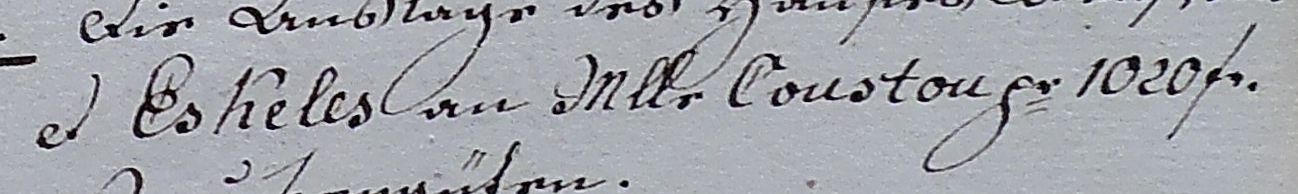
et Eskeles an Mlle Coustou pr͇ 1020fr.
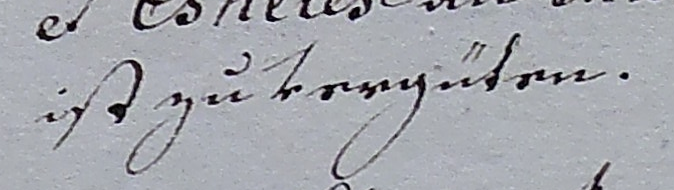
ist zu vergüten.
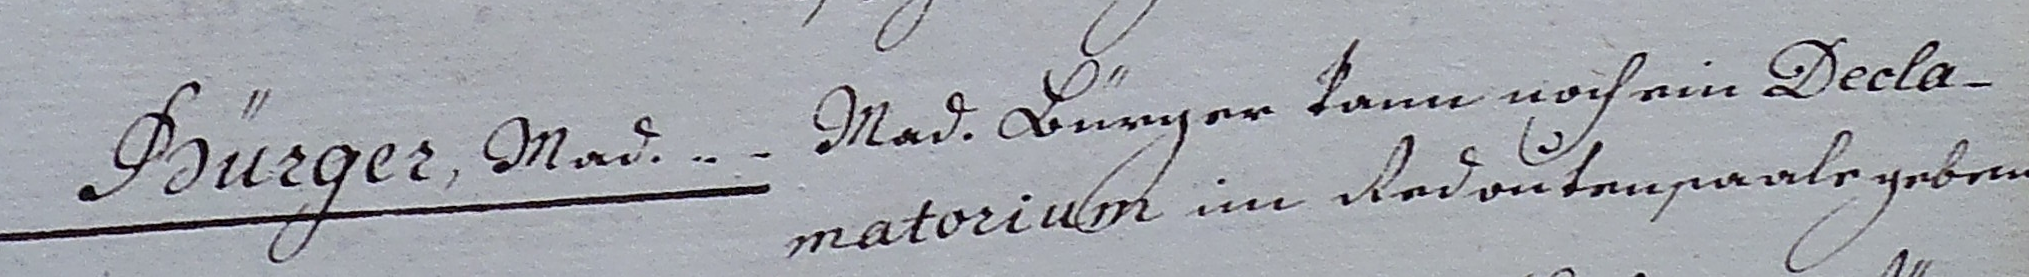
Bürger, Mad. .. .. Mad. Bürger kann noch ein Decla¬
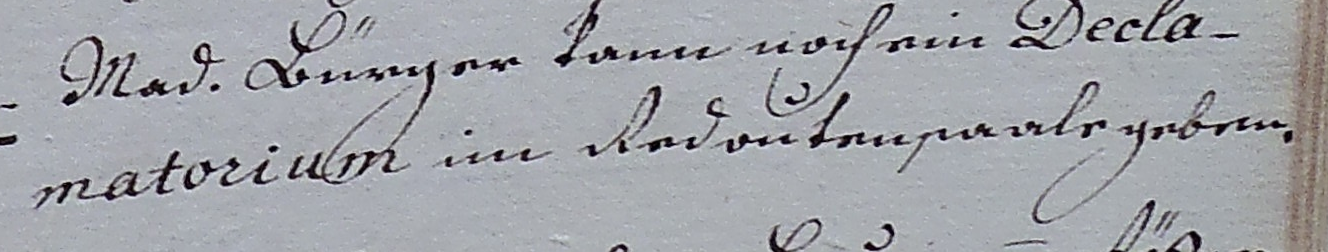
matorium im Redoutensaale geben.
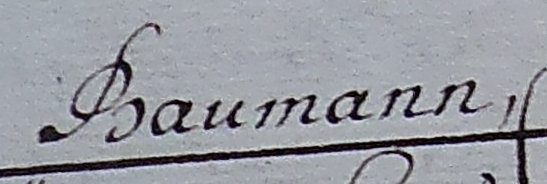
Baumann,
